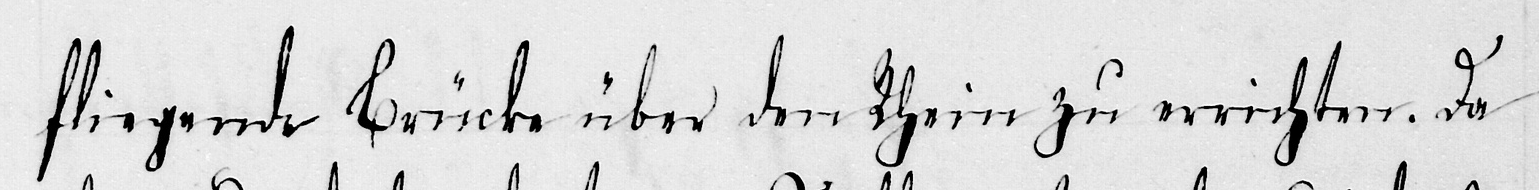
fliegende Brücke über den Rhein zu errichten. Da
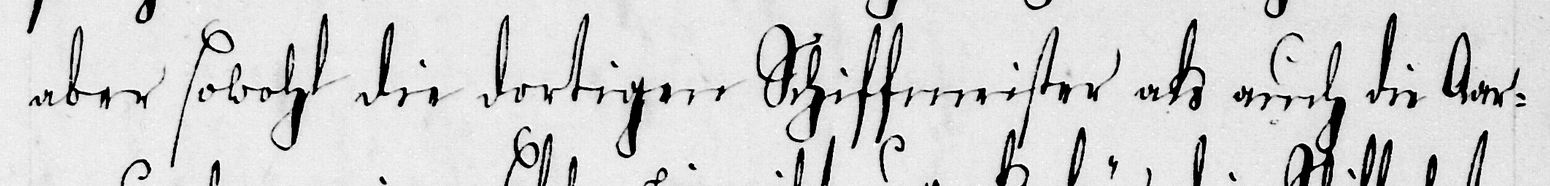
aber sowohl die dortigen Schiffmeister als auch die Aar¬
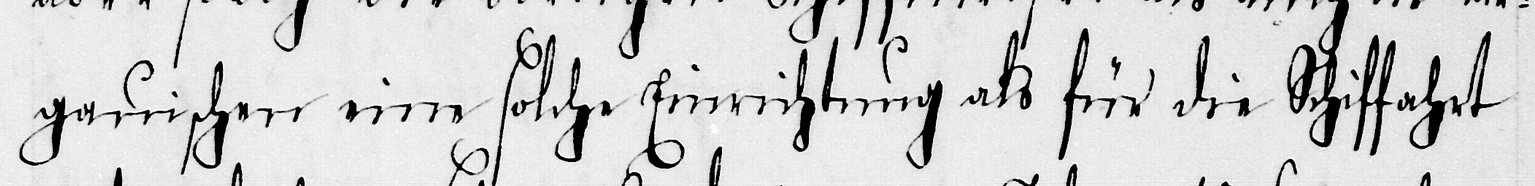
gauischen eine solche Einrichtung als für die Schiffahrt
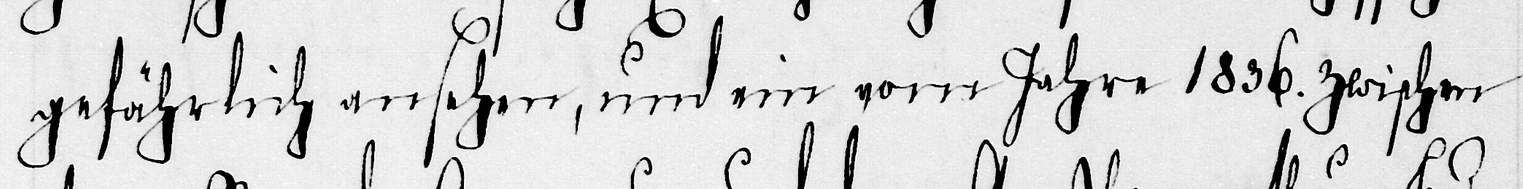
gefährlich ansehen, und ein vom Jahre 1836. zwischen
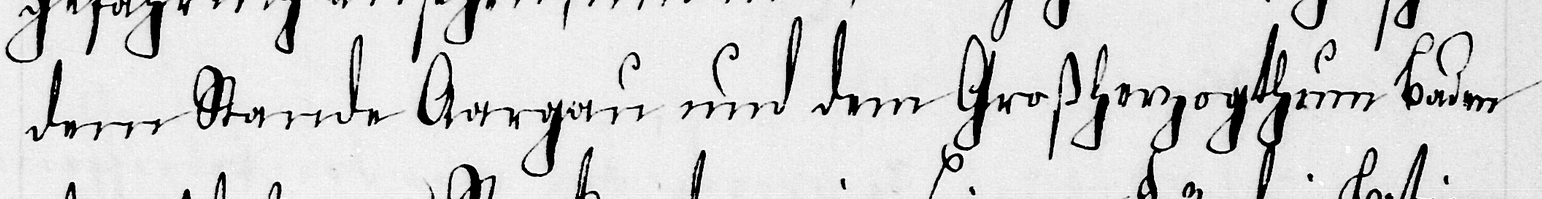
dem Stande Aargau und dem Großherzogthum Baden
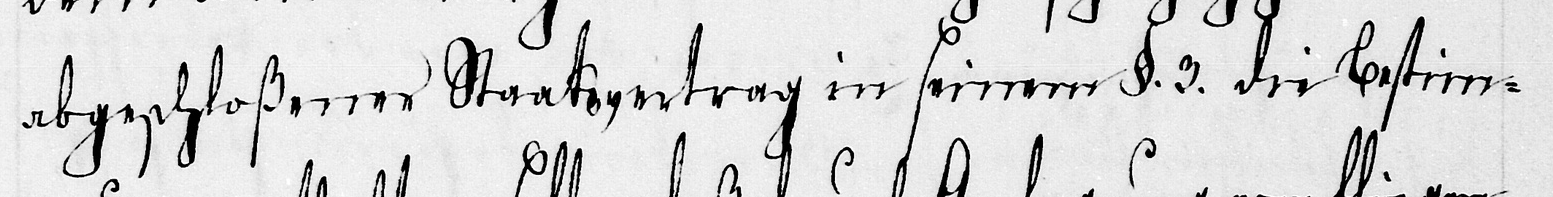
abgeschloßener Staatsvertrag in seinem §. 3. die Bestimm¬
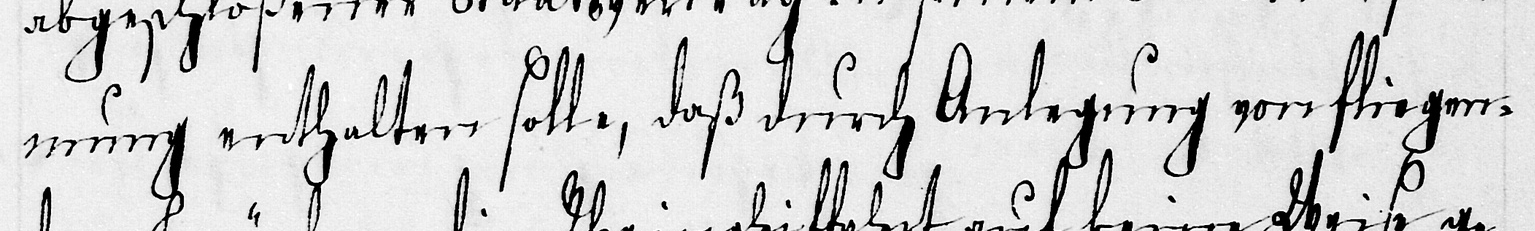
ung enthalten solle, daß durch Anlegung von fliegen¬
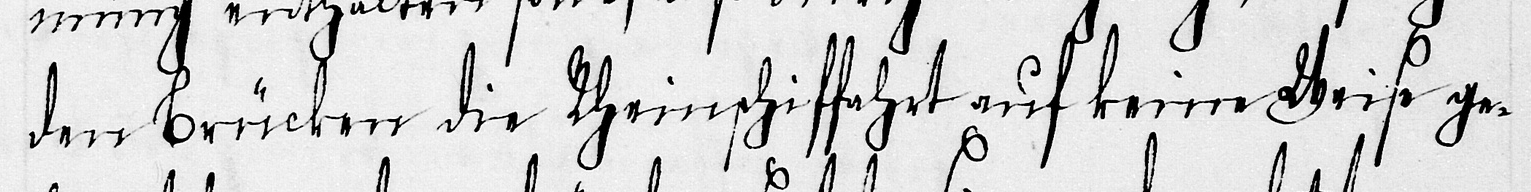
den Brücken die Rheinschiffahrt auf keine Weise ge¬
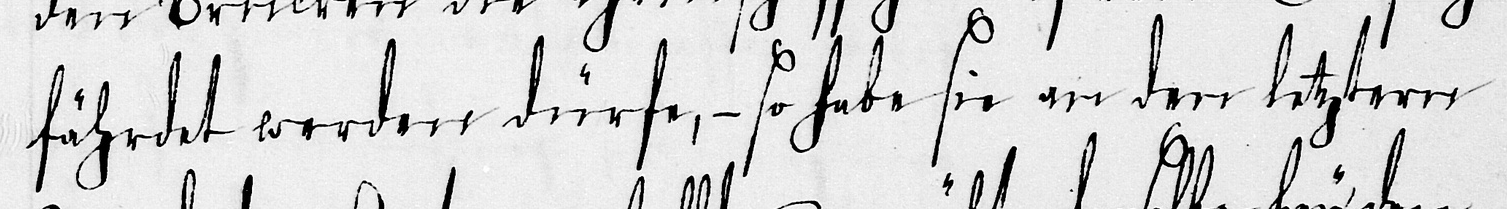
fährdet werden dürfe, – so habe sie an den letztern
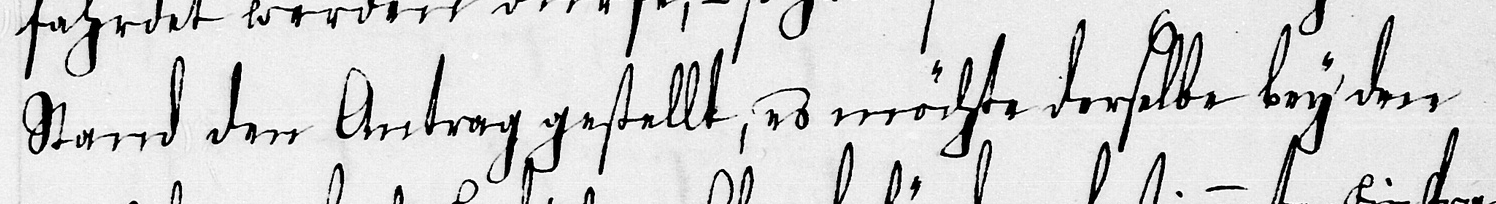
Stand den Antrag gestellt, es möchte derselbe bey den
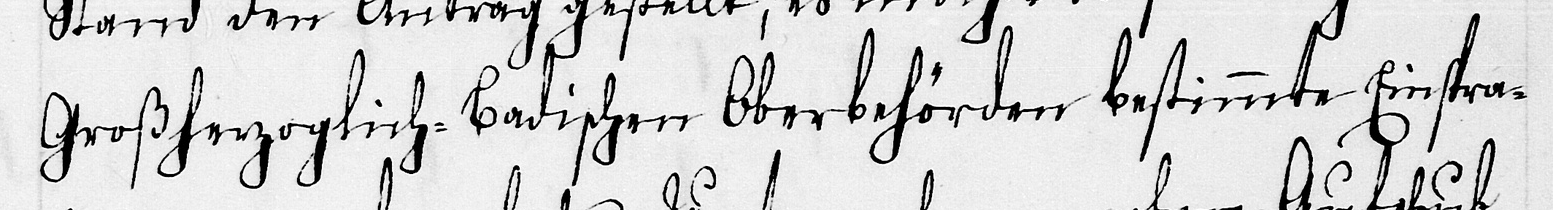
Großherzoglich-Badischen Oberbehörden bestimmte Einspra¬
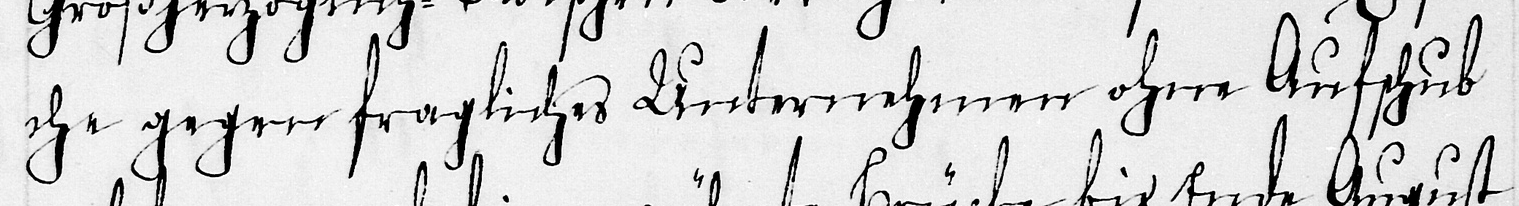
che gegen fragliches Unternehmen ohne Aufschub
